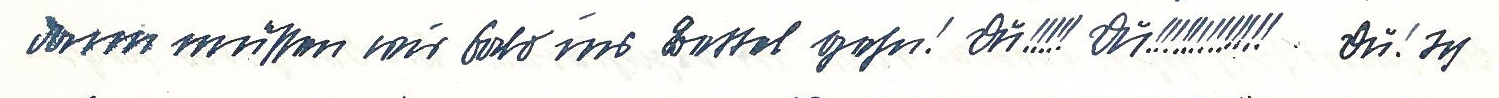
dann müssen wir bald ins Bettel gehen! Du!!!!! Du!!!!!!!!!!!!! Du! Ich
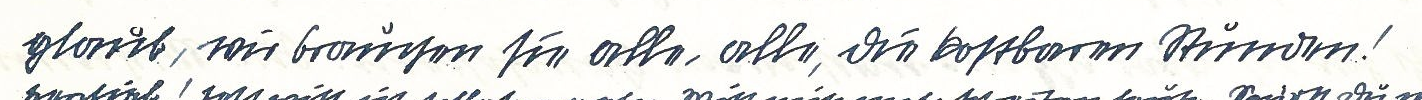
glaub, wir brauchen sie alle, alle, die kostbaren Stunden!
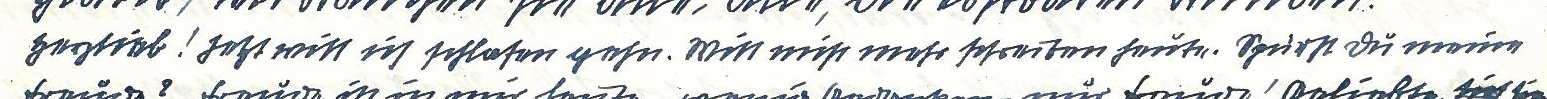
Herzlieb! Jetzt will ich schlafen gehen. Will nicht mehr schreiben heute. Spürst Du meine
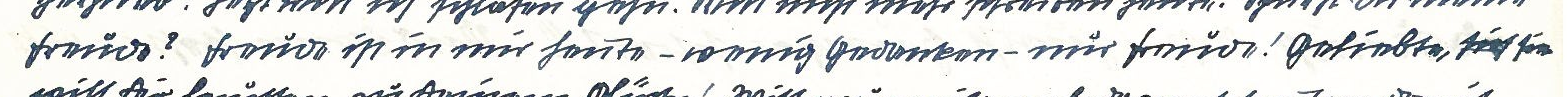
Freude? Freude ist in mir heute – wenig Gedanken – nur Freude! Geliebte, sich sie
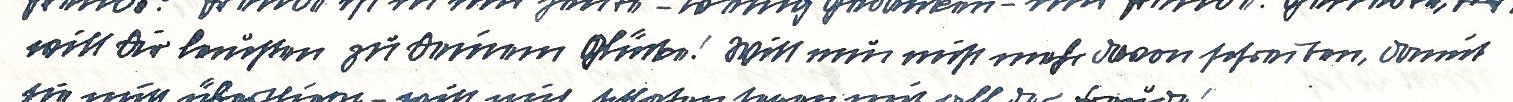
will Dir leuchten zu Deinem Glücke! Will nun nicht mehr davon schreiben, damit
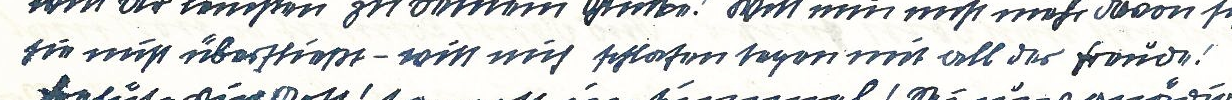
sie nicht überfließt – will mich schlafen legen mit all der Freude!
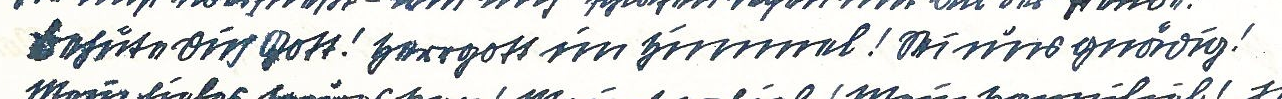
Behüte Dich Gott! Herrgott im Himmel! Sei uns gnädig!
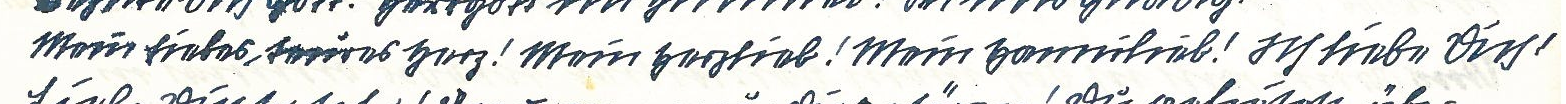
Mein liebes, teures Herz! Mein Herzlieb! Mein lieb! Ich liebe Dich!
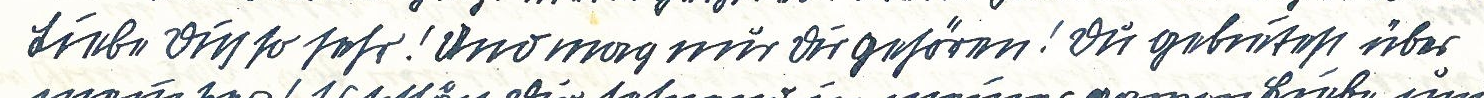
Liebe Dich so sehr! Und mag nur Dir gehören! Du gebietest über
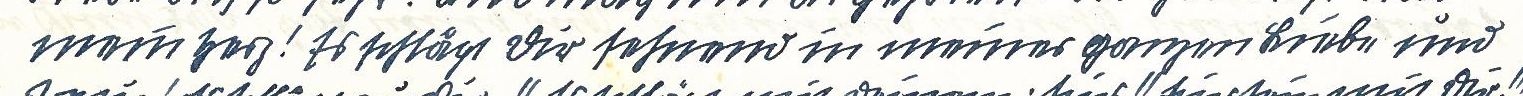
mein Herz! Es schlägt Dir sehnend in meiner ganzen Liebe und
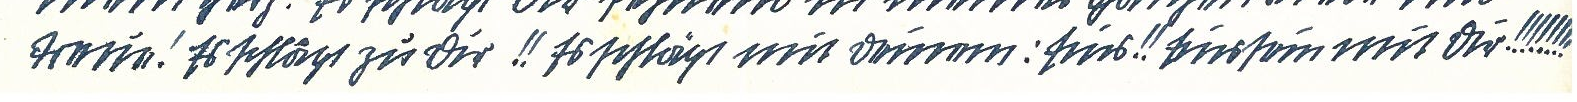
Treue! Es schlägt mit Dir!! Es schlägt mit Deinem: Eins!! Einssein mit Dir!!!!!!!!
